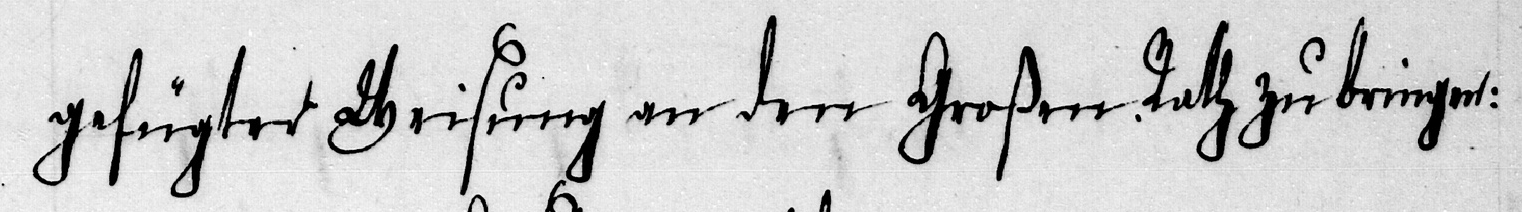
gefügter Weisung an den Großen Rath zu bringen:
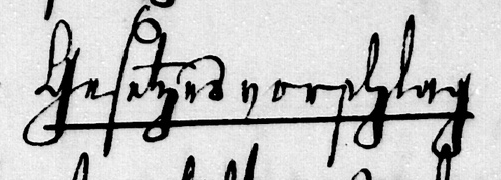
Gesetzesvorschlag
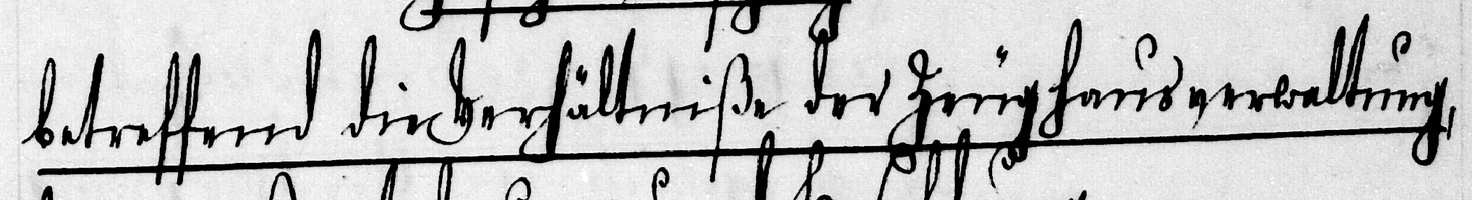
betreffend die Verhältniße der Zeughausverwaltung,
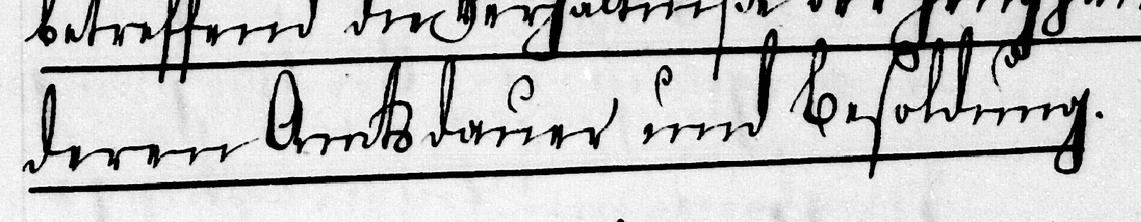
deren Amtsdauer und Besoldung.
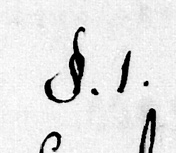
§. 1.
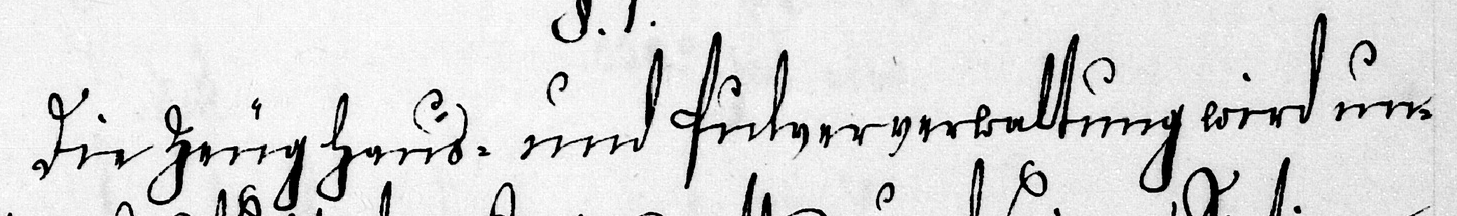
Die Zeughaus- und Pulververwaltung wird un¬
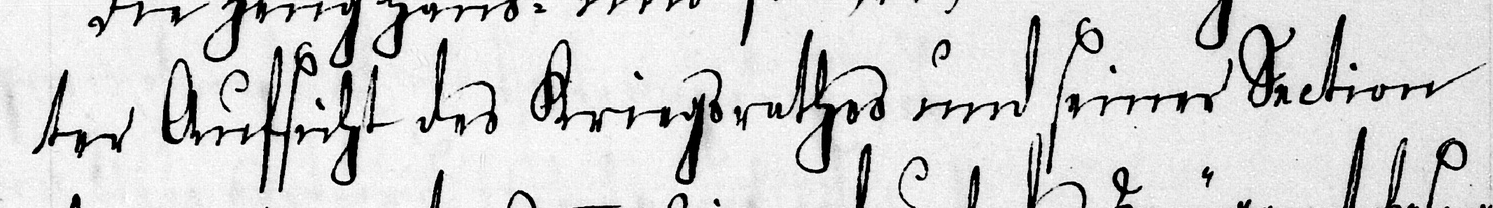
ter Aufsicht des Kriegsrathes und seiner Section
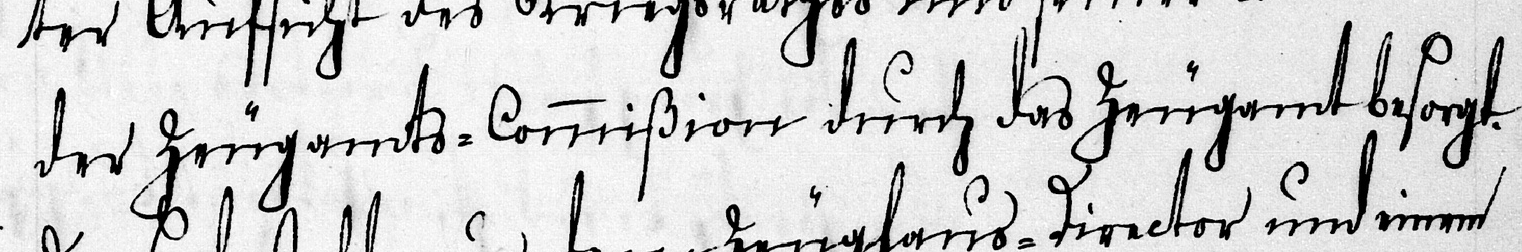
der Zeugamts-Commißion durch das Zeugamt besorgt.
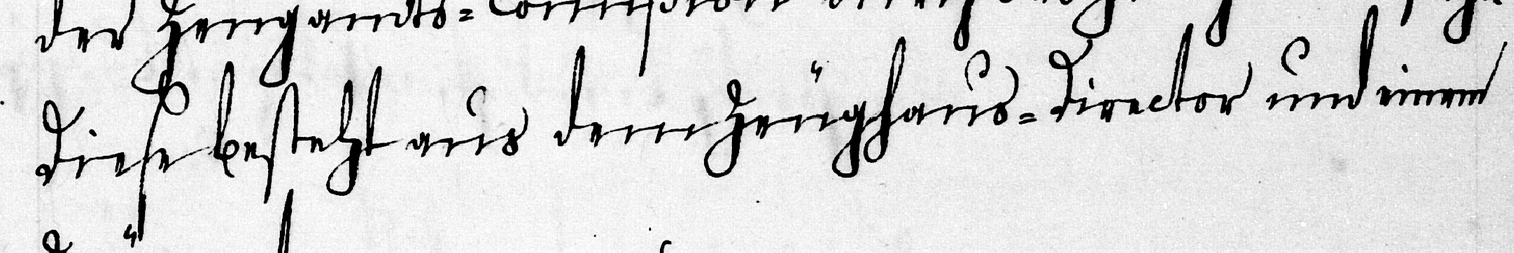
Diese besteht aus dem Zeughaus-Director und einem
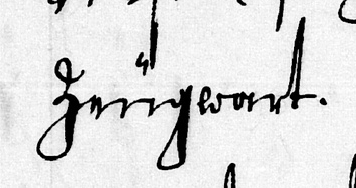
Zeugwart.
